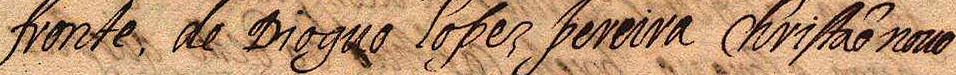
fronte, de Dioguo Lopez pereira christão nouo
